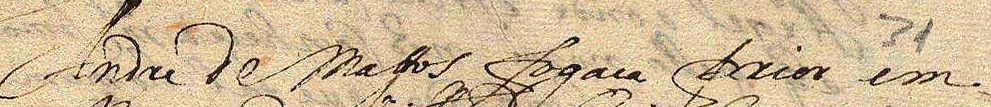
Andre de mattos fogaça prior em
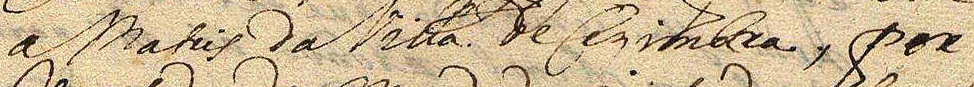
a matris da Villa de Cezimbra, por
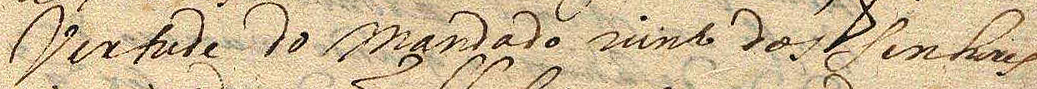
Vertude do mandado iunto dos senhores
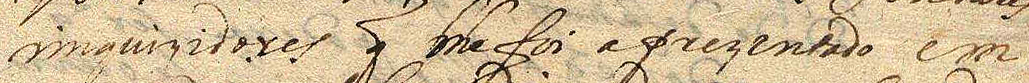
imquizidores q̄ lhe foi aprezentado em
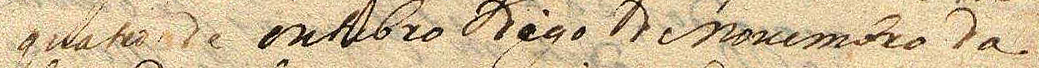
quatro de outubro digo de nouembro da
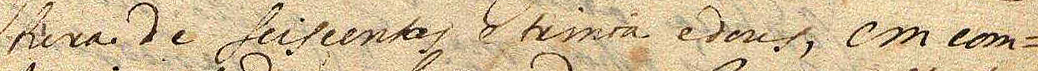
hera de seiscentos, E trinta e dous, em com
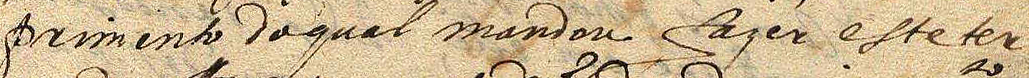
primento do qual mandou fazer este ter
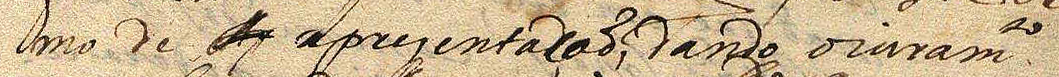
mo de _ aprezentaçaõ, dando o iuramto
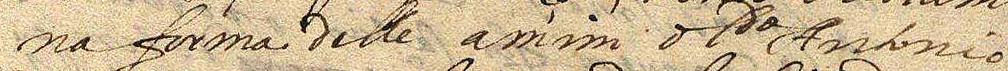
na forma delle a mim o ldo Antonio
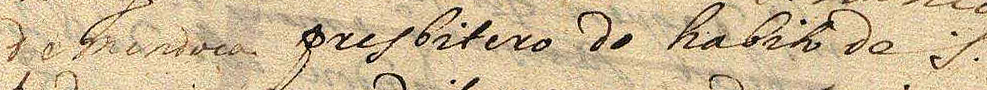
de mendoça presbitero do habito de S.
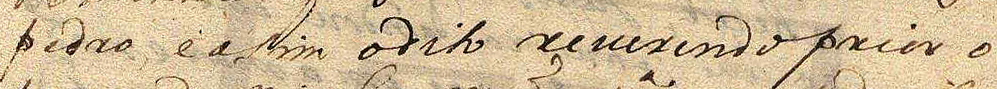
pedro, e asim o dito reuerendo prior o
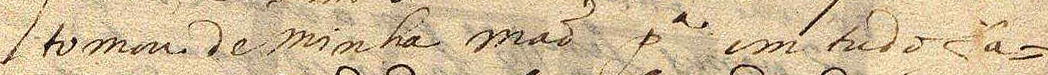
tomou de minha maõ pa em tudo fa
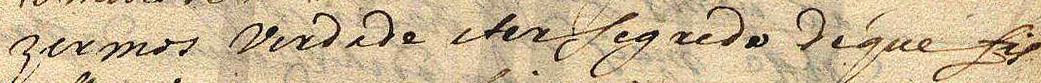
zermos verdade e ter segredo de que fis
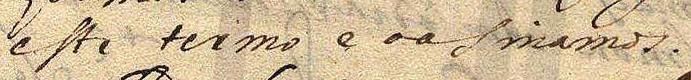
este termo e o asinamos.
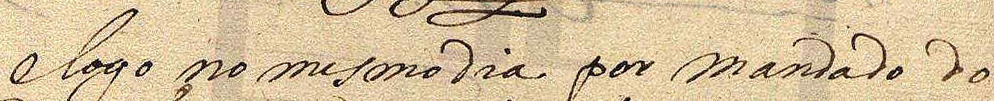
e logo no mesmo dia por mandado do
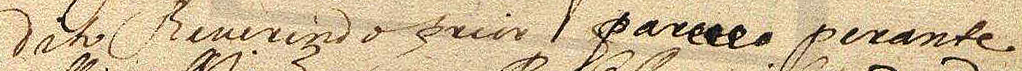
dito Reuerendo prior pareceo perante
